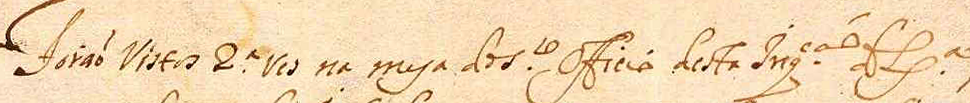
Foraõ Vistos 2.a ves na mesa do s.to Officio desta Inq.çaõ d̄ Lxa
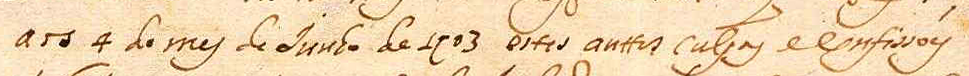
aos 4 do mes de Iunho de 1703 estes auttos culpas e confissoẽs
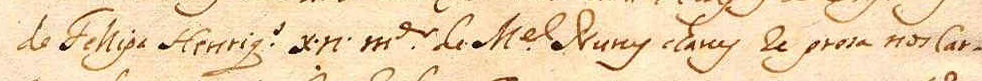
de Fellipa Henriq. x.n. m.er de M.el Nunes chaues Re presa nos Car
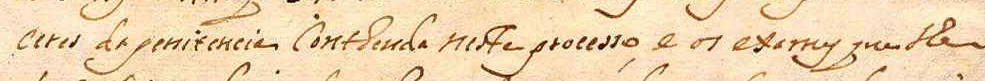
ceres da penitencia Contheuda neste processo, e os exames que lhe
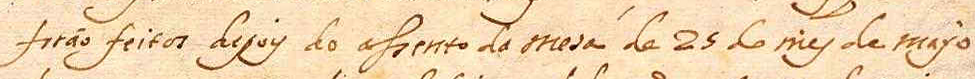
foraõ feitos depois do assento da mesa de 25 do mes de mayo
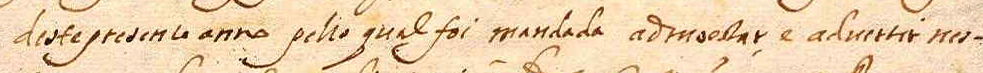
deste presente anno pello qual foi mandada admoestar, e aduertir nes
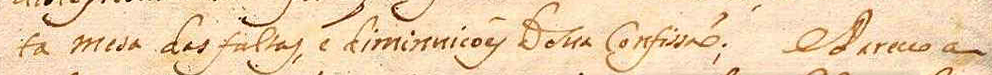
ta mesa das faltas, e diminuiçoẽs d̄ sua Confissaõ; E Pareceo a
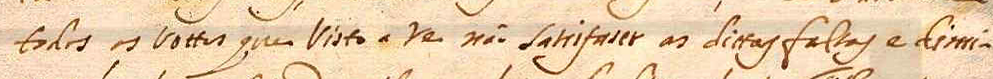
todos os vottos que Visto a re naõ satisfaser as dittas faltas e dimi
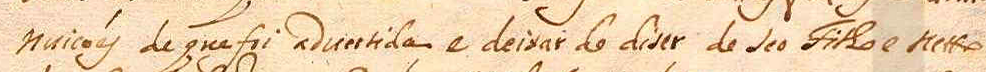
nuiçoẽs de que foi aduertida, e deixar de diser, de seo Filho e netto
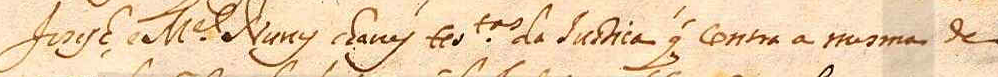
Joseph, e M.el Nunes chaues test.as da Iustiça q̄ contra a mesma de
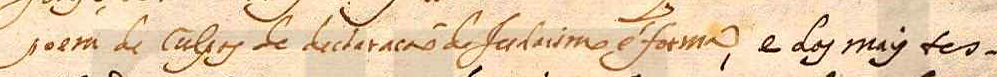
poem de culpas de declaraçaõ de Judaismo ē forma, e das mais tes
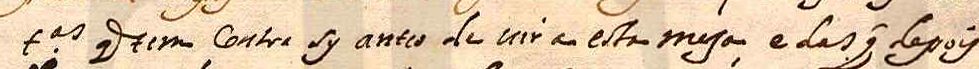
t.as q̄ tem contra sy antes de uir a esta meza, e das q̄ depois
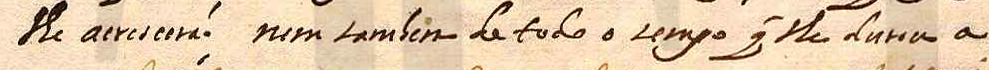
lhe acrescerā; nem tambem de todo o tempo q̄ lhe durou a
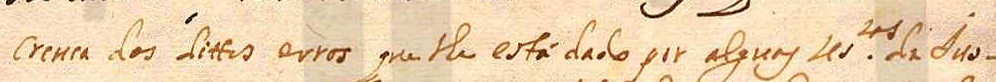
crença dos dittos erros que lhe está dado por alguas tes.tas da Ius
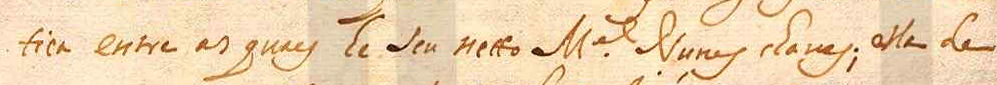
tiça entre as quaes he seu netto M.el Nunes chaues; ella de
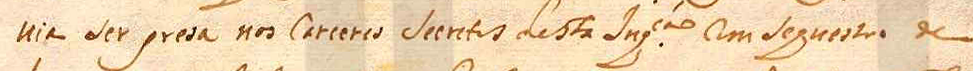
uia ser presa nos carceres Secretos desta Inq.aõ com sequestro de
